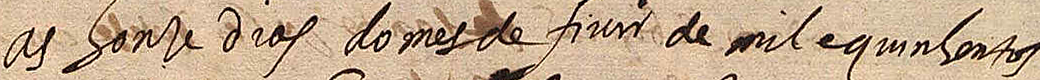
as honze dias do mes de fiuero de mil e quinhentos
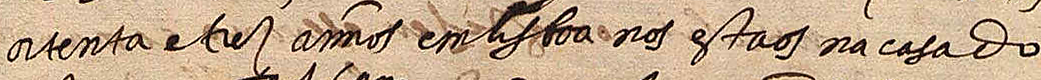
oitenta e trez annos em lisboa nos estaos na casa do
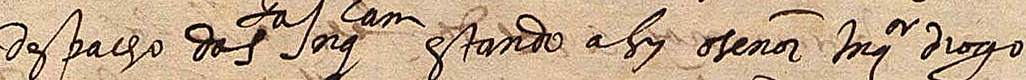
despacho da sta Inqçam estando ahy o senor̄ Inqor diogo
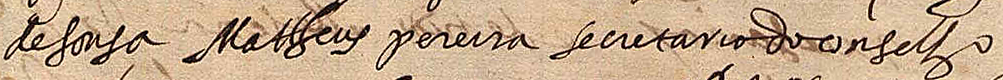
de sousa Mattheus pereira secretario do conselho
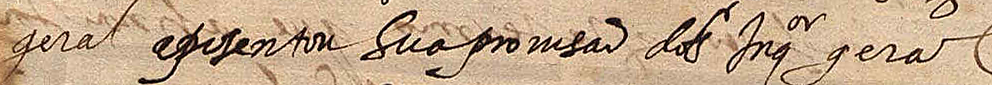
geral aprezentou hua prouisaõ do sr Jnqor geral
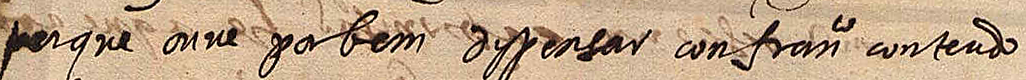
por que ouue por bem dispensar con franco conteudo
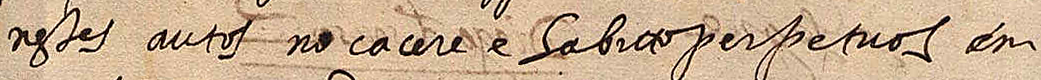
nestes autos no cacere e habitto perpetuos em
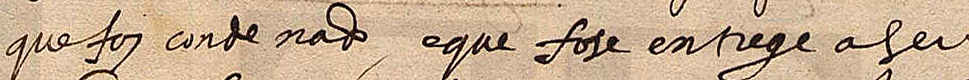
que foj condenado, e que fose entrege a seu
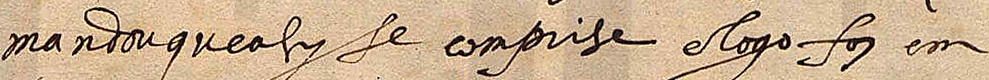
mandou que asy se comprise e logo foj em
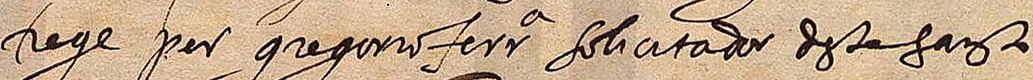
trege per gregorio ferra solicitador deste santo
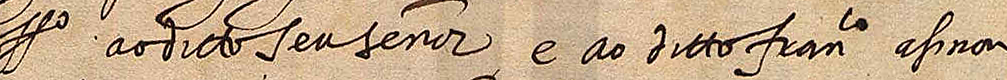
offo ao ditto seu sen̄or e ao ditto franco asinou
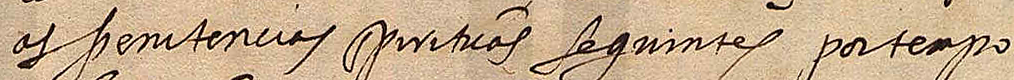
as penitencias spirituās seguintes por tempo
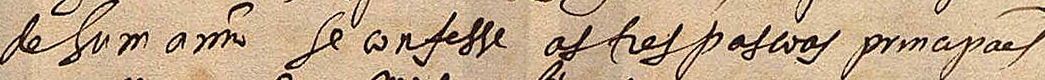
de hum annō se confesse as tres pascoas principaēs
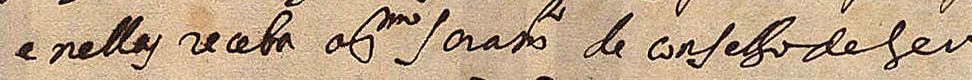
e nellas receba o smo scramto de conselho de seu
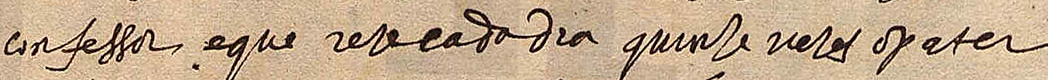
confessor e que reze cada dia quinze uezes o pater
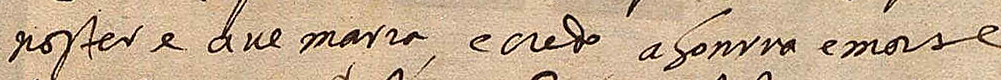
noster e aue maria, e credo a honrra e morte
